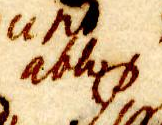able
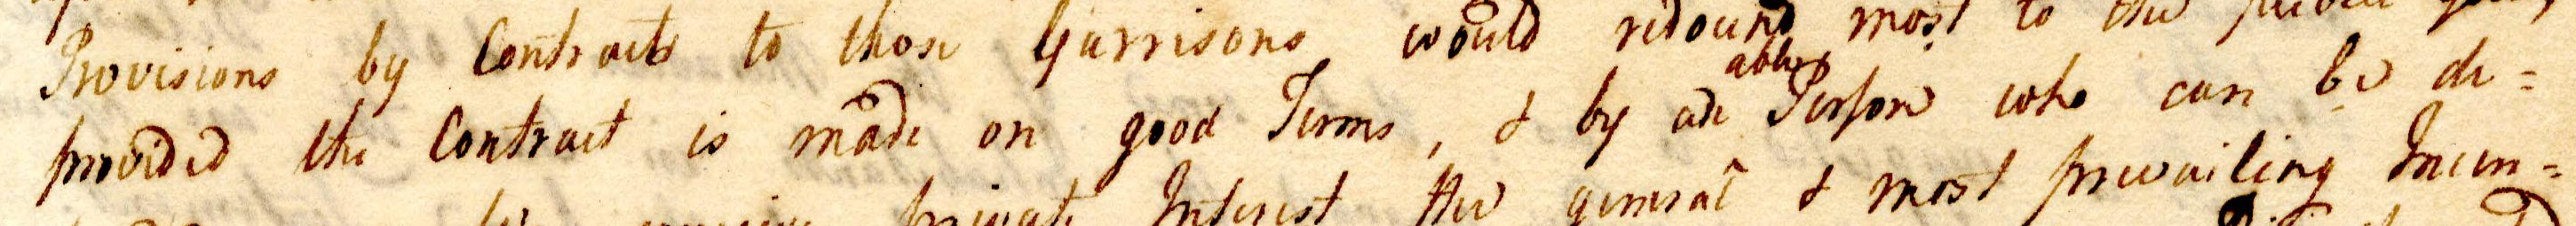provided the Contract is made on good Terms, & by an^ Person who can be de-
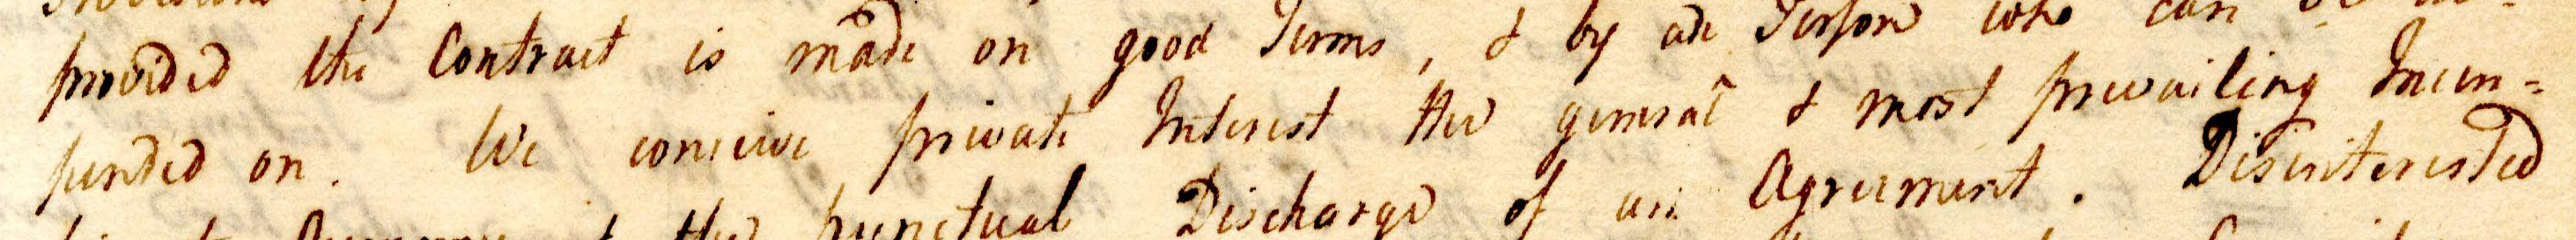pended on. We conceive private Interest the general & most prevailing Incen-
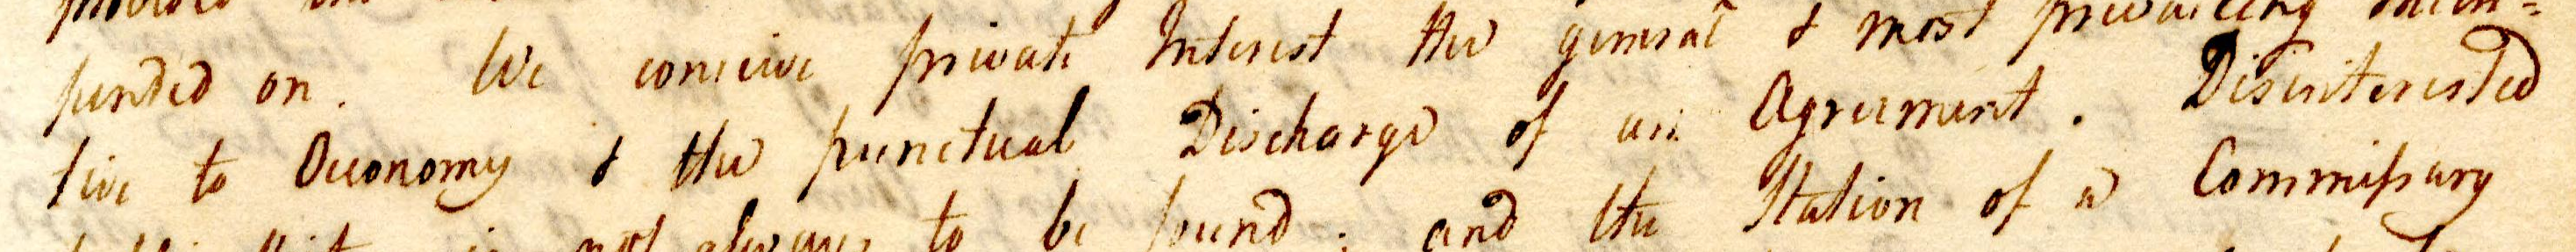tive to Oeconomy & the punctual Discharge of an Agreement. Disinterested
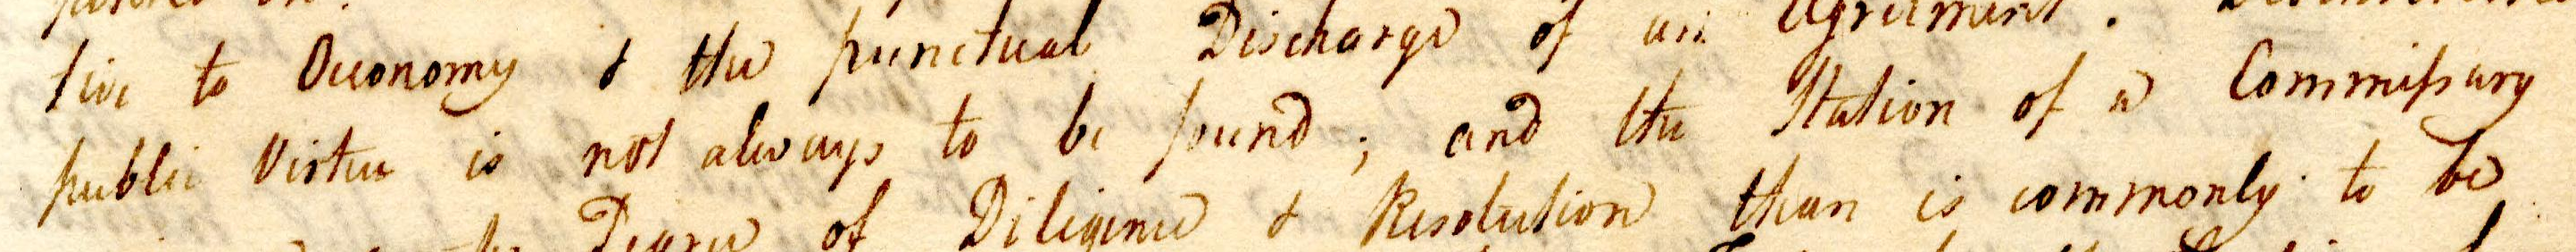public Virtue is not always to be found; and the Station of a Commissary
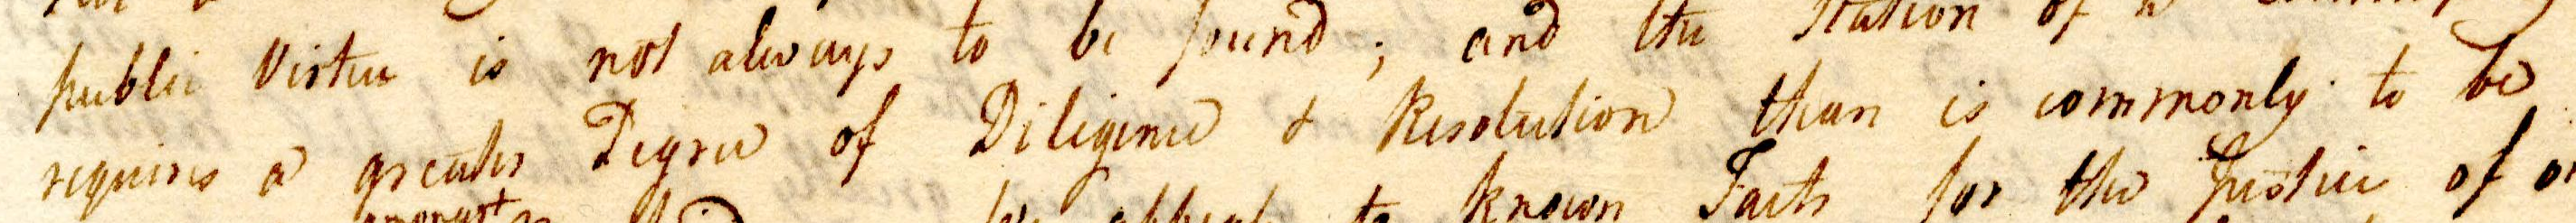requires a greater Degree of Diligence & Resolution than is commonly to be
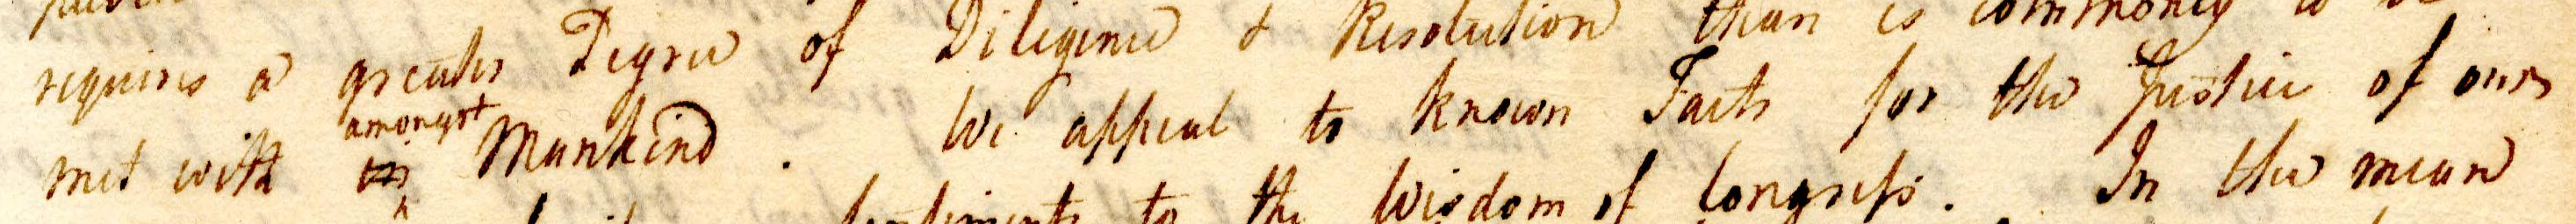met with in ^ Mankind. We appeal to known Facts for the Justice of our
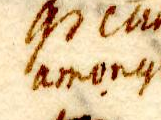amongst
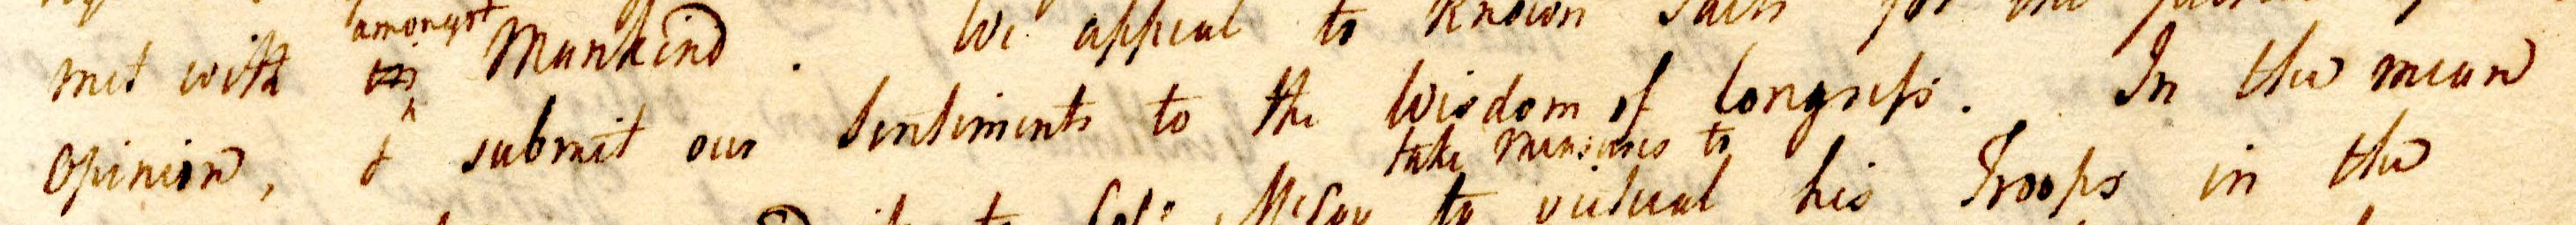opinion, & submit our Sentiments to the Wisdom of Congress. In the mean
